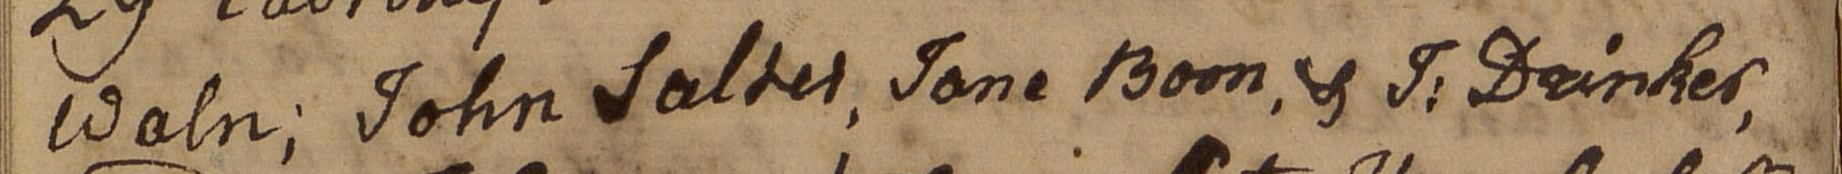Waln; John Salter, Jane Boon, & T: Drinker,
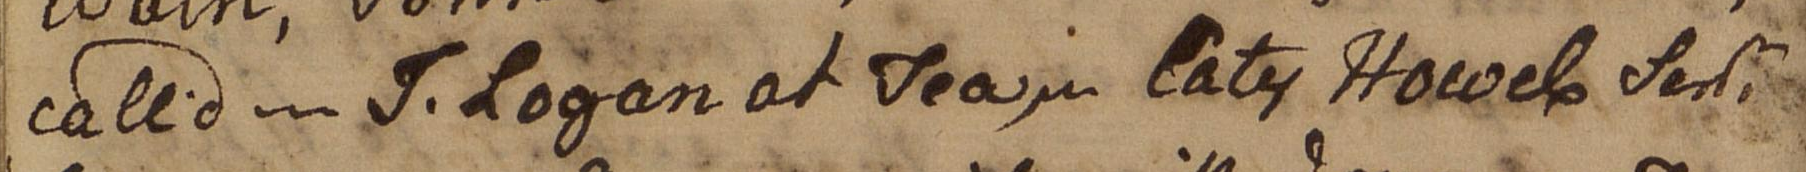call'd- T Logan at Tea- Caty Howel Sen^r
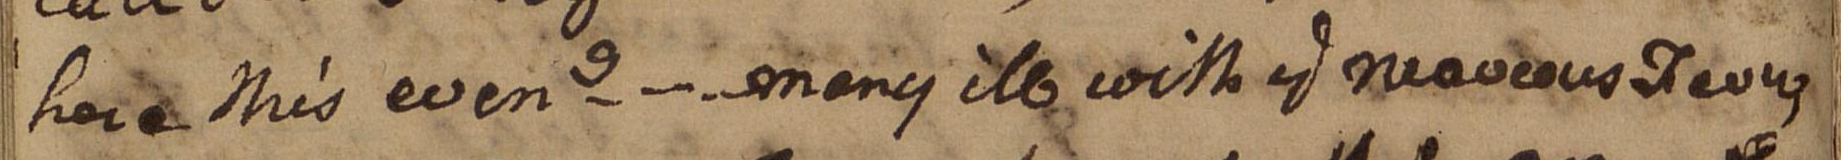here this even^g--- many ill with y^e nerveous Fever,
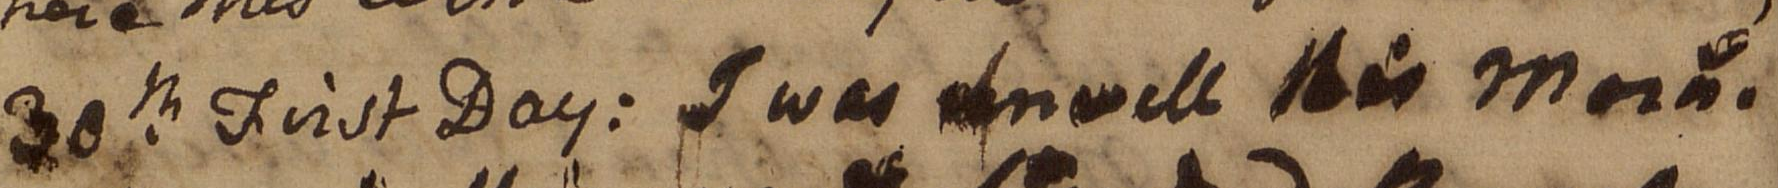30.^th First Day: I was unwell this Morn.^g
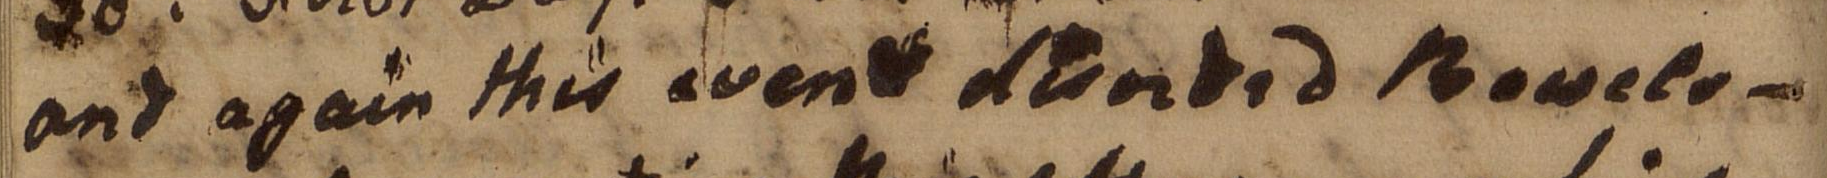and again this even^g disordrd Bowels-
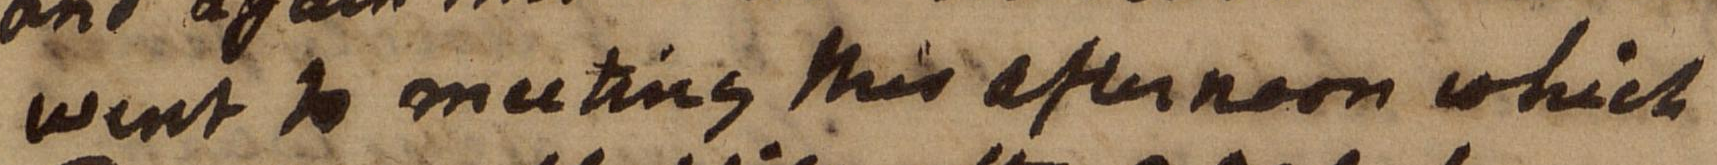went to meeting this afternoon which
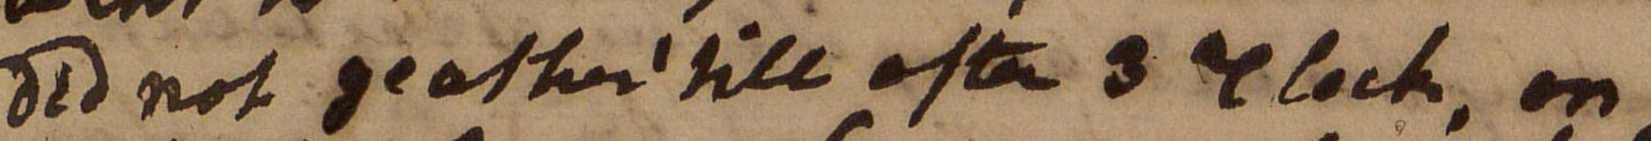did not geather till after 3 ^o Clock, on
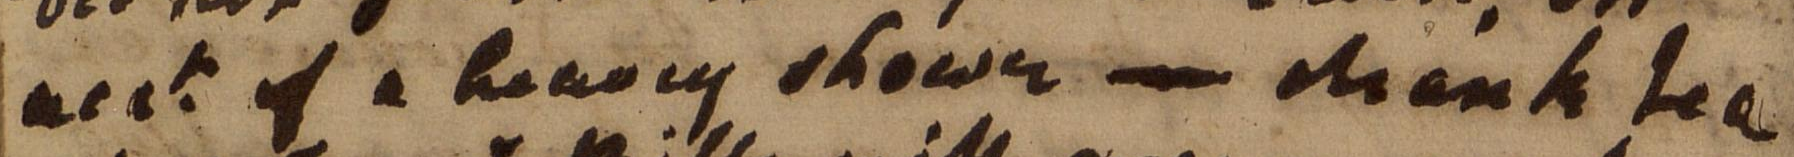acc^t of a heavey shower- drank tea
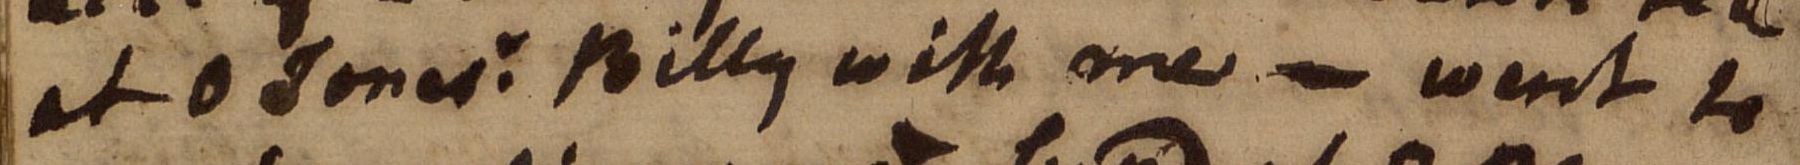at O Jones^s Billy with me- went to
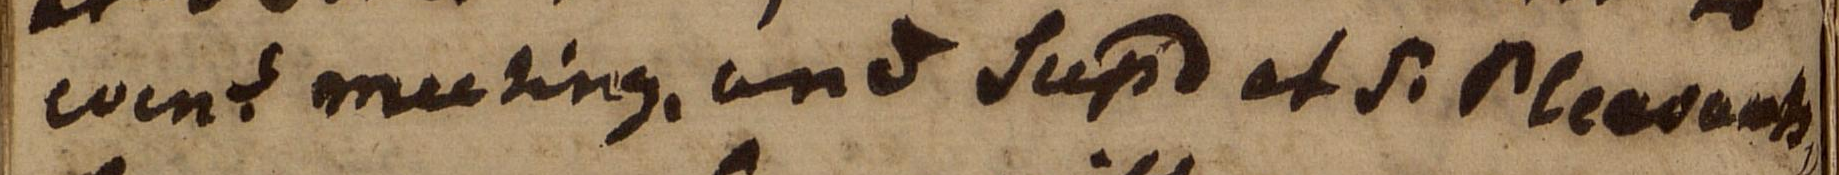even^g meeting, and sup'd at S. Pleasants
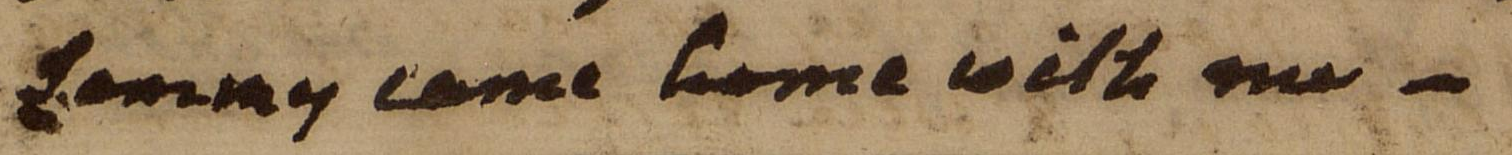Sammy came home with me-
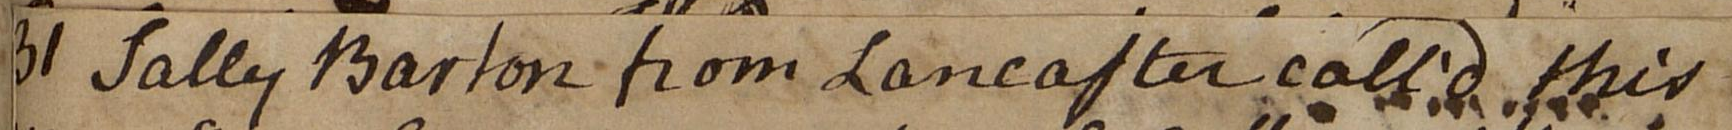31 Sally Barton from Lancaster call'd this
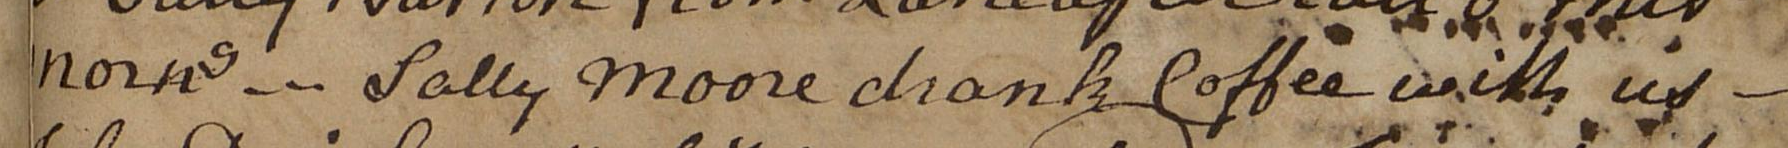morn^g- Sally Moore drank Coffee with us-
